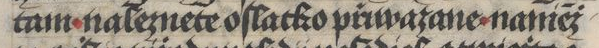tam.naleznete oſlatko přiwazane. naniēż
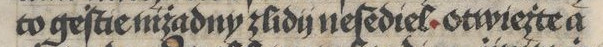to geẛtie niżadný z lidij neſediel.otwieżte a
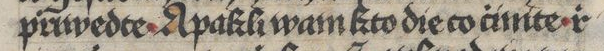pṙiwedte.A pakli wam kto die to ċinite.ṙ¬
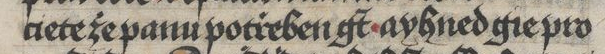ciete że panu potṙeben ḡt.a yhned gie pro¬
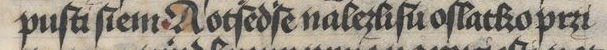puſti ſiem.A otẛedẛe nalezli ſu oſlatko przi¬
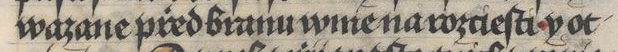wazane pṙed branú wníe na rozcieſti.y ot¬
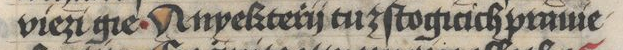viezí gie.A nyekteṙij tu zſtogicich prauie¬
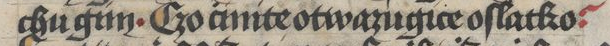chu gím.Czo ċinite otwázugíce oſlatko?
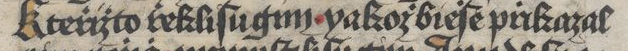Kteṙížto ṙekli ſu gim.yakož bíeẛe pṙikazal
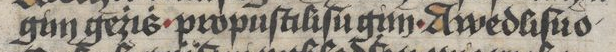gím geżíṡ.propuſtili ſu gim.A wedliſu o¬
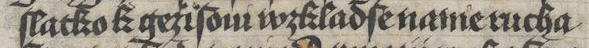ſlatko k geżíẛoui wzkladẛe naníe rucha
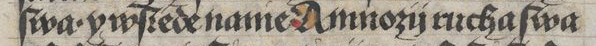ſwa.y wſiede na nie.A mnozij rucha ſwa
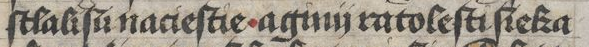ſtlali ſu nacieſtie.a ginij ratoleſti ſieka¬
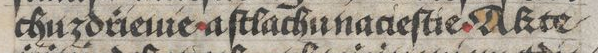chu zdṙíeuíe.a ſtlachu na cieſtie.A kte¬
